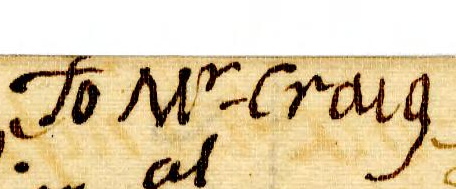to M^r-Craig
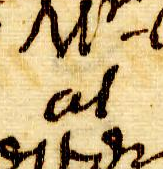at
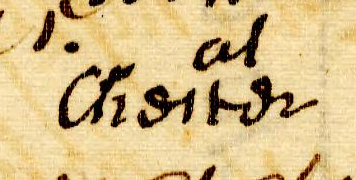Chester
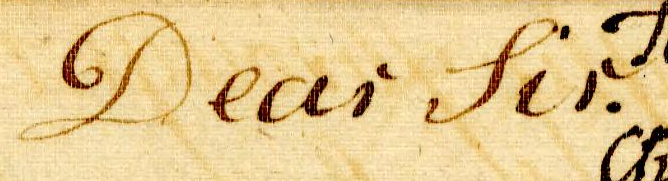Dear Sir.
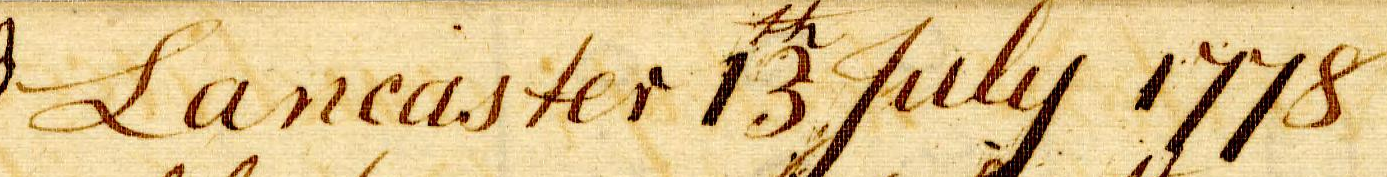Lancaster 13 July 1778
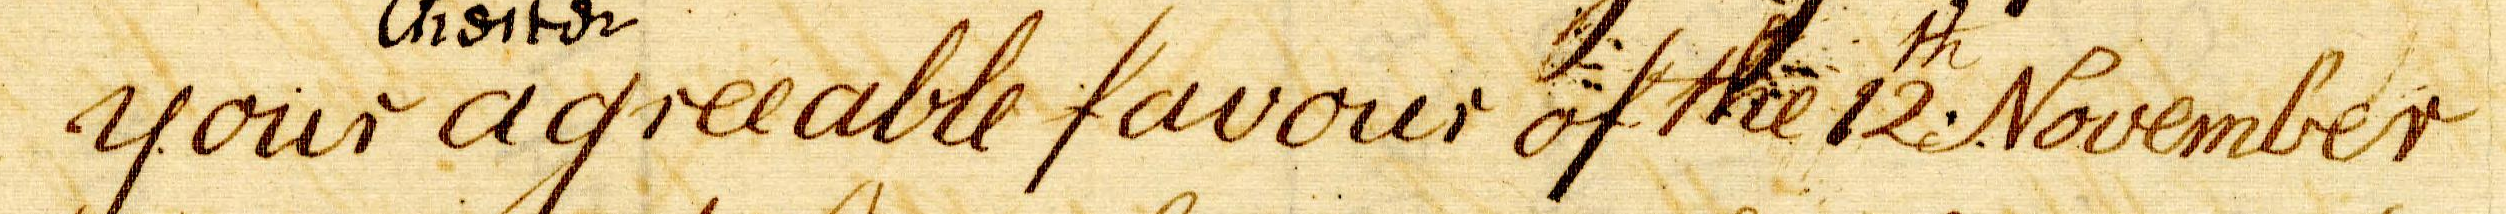Your agreeable favour of the 12^th: November
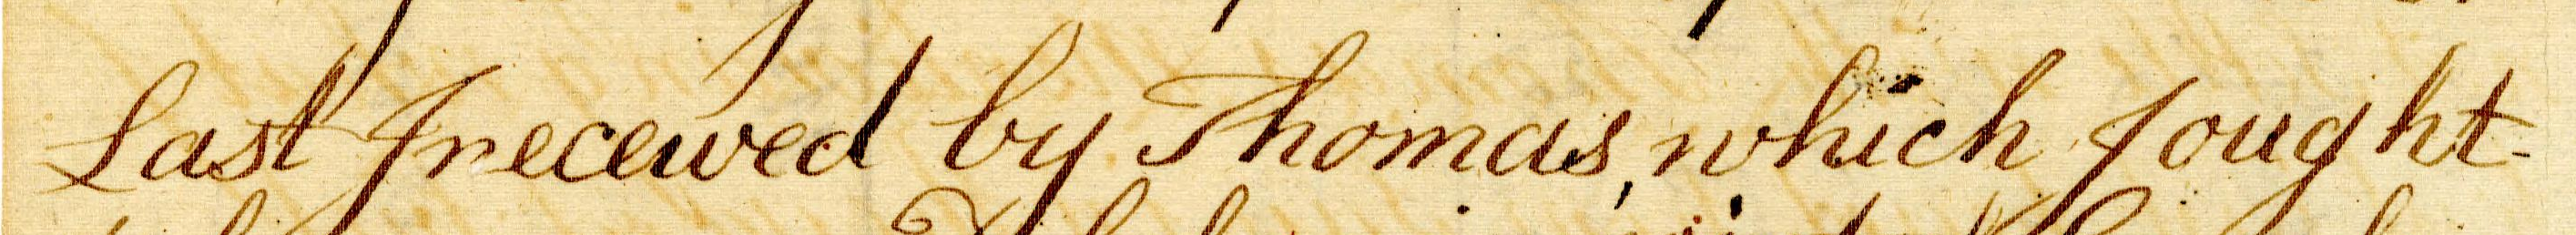Last I received by Thomas, which I ouhgt-
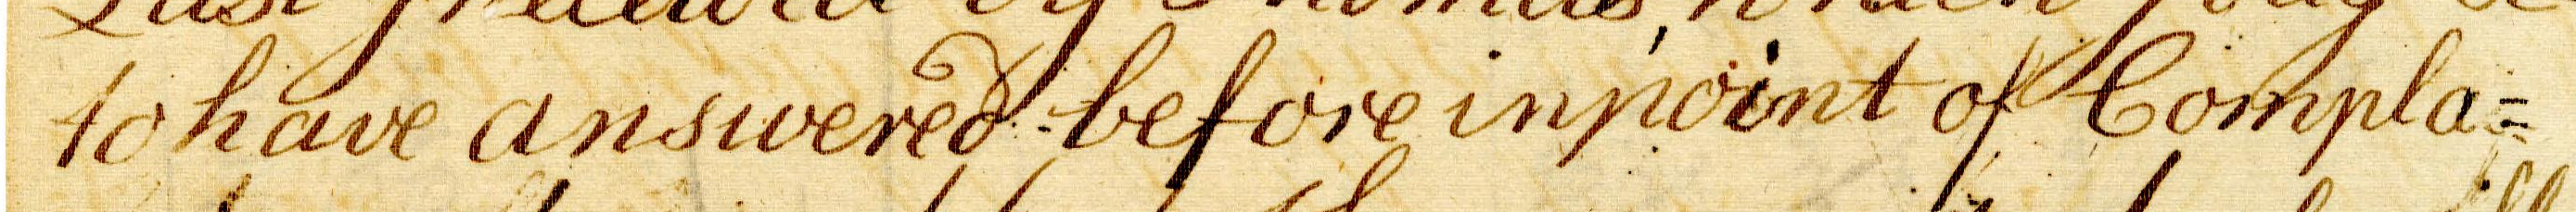to have answered before in point of Compla=
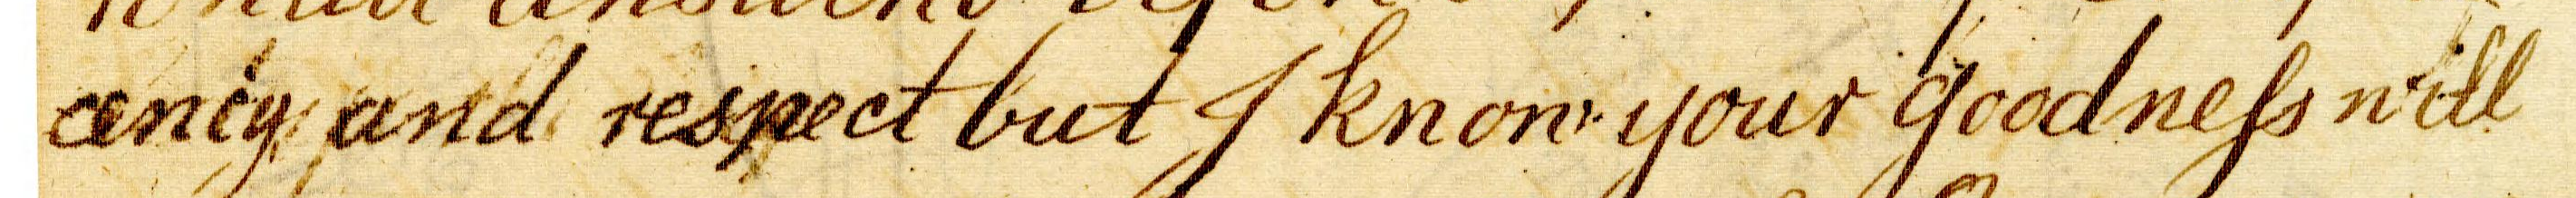cency and respect but I know your goodness will
